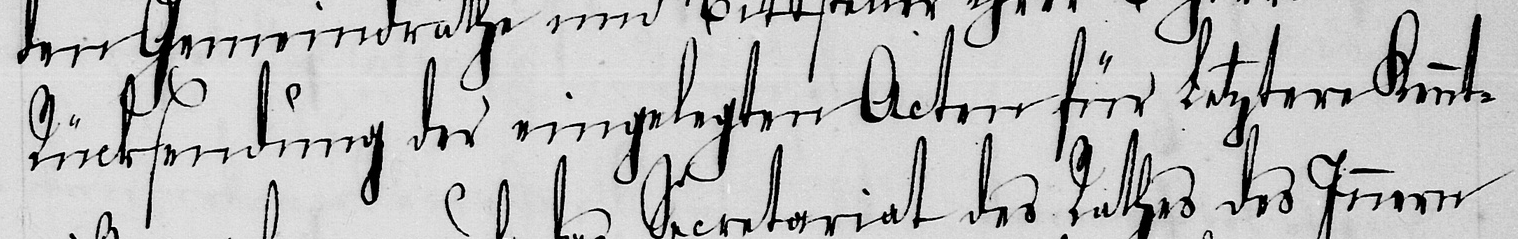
Rücksendung der eingelegten Acten für Letztere Kenn¬
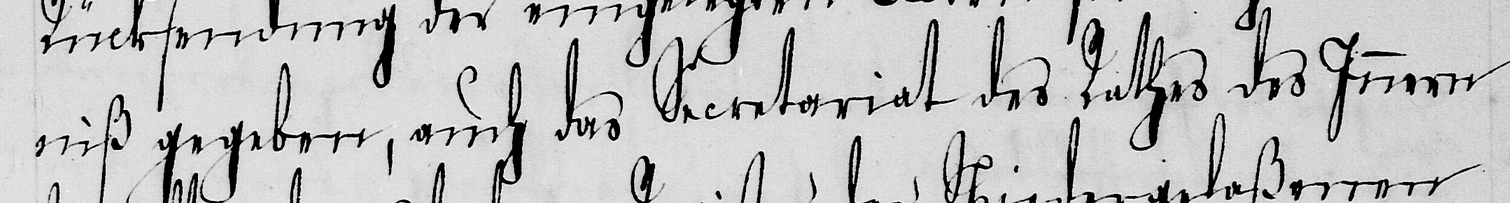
tniß gegeben, auch das Secretariat des Rathes des Innern
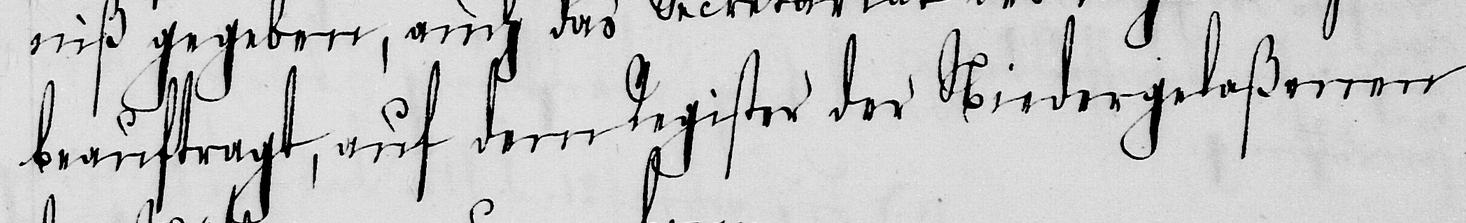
beauftragt, auf dem Register der Niedergelaßenen
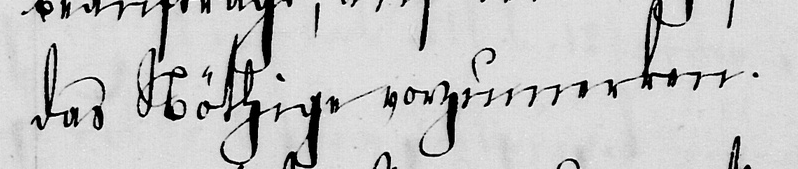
das Nöthige vorzumerken.
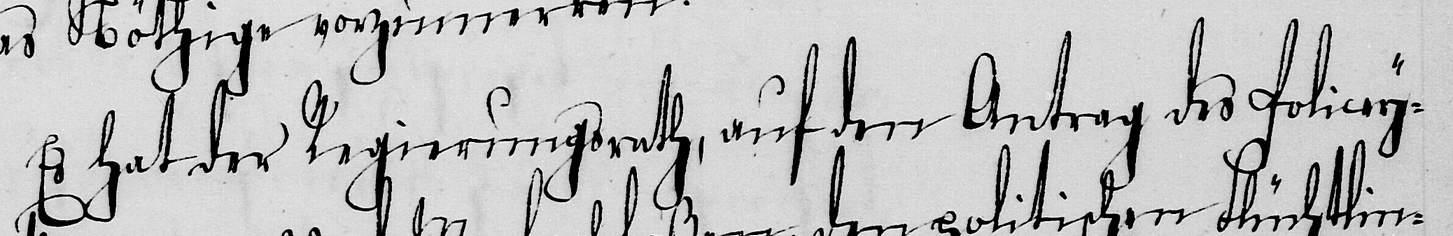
Es hat der Regierungsrath, auf den Antrag des Policey¬
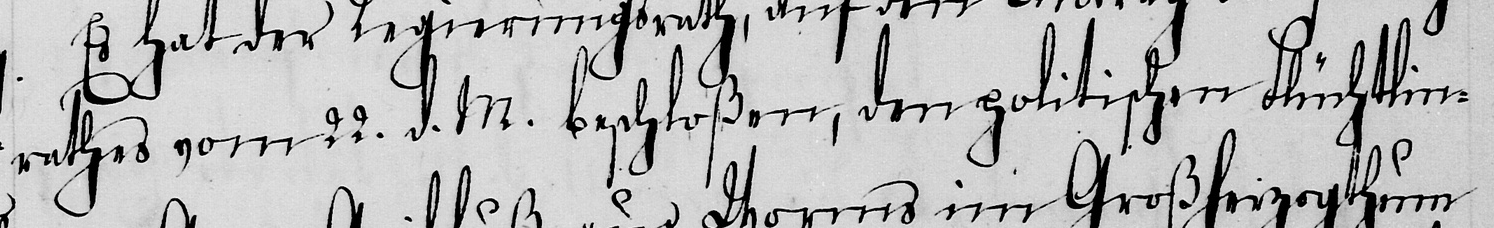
rathes vom 22. d. M. beschloßen, den politischen Flüchtlin¬
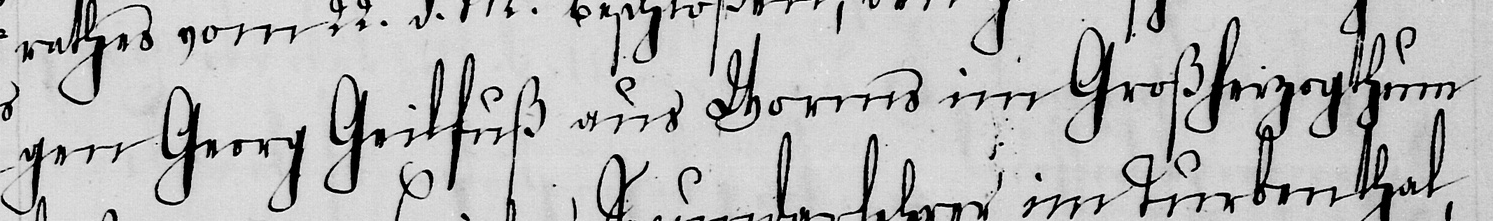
gen Georg Geilfuß aus Worms im Großherzogthum
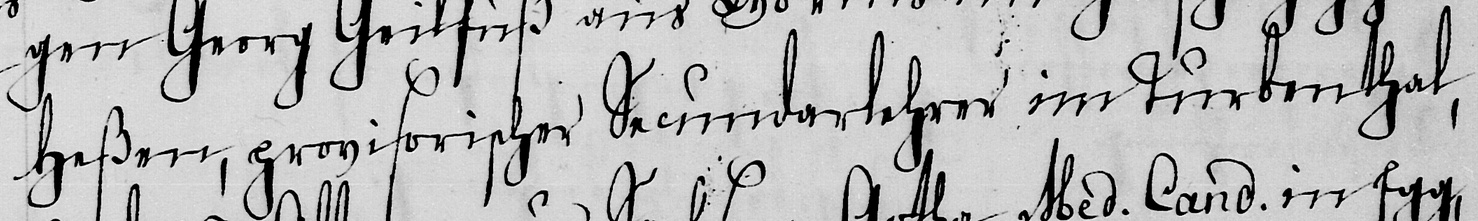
Heßen, provisorischer Secundarlehrer im Turbenthal,
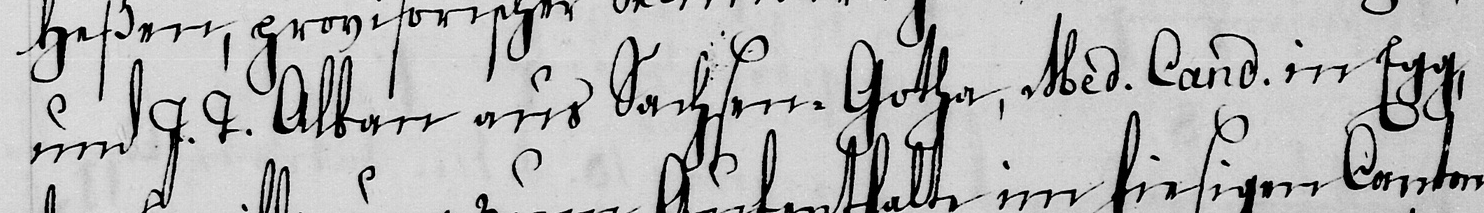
und J. T. Alban aus Sachsen-Gotha, Med. Cand. in Egg,
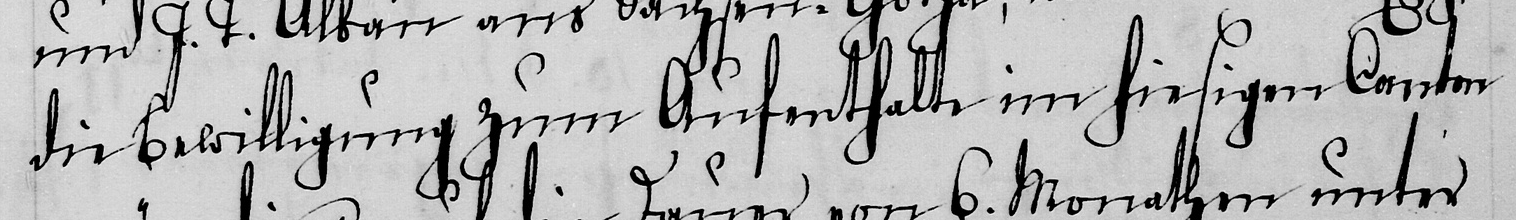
die Bewilligung zum Aufenthalte im hiesigen Canton
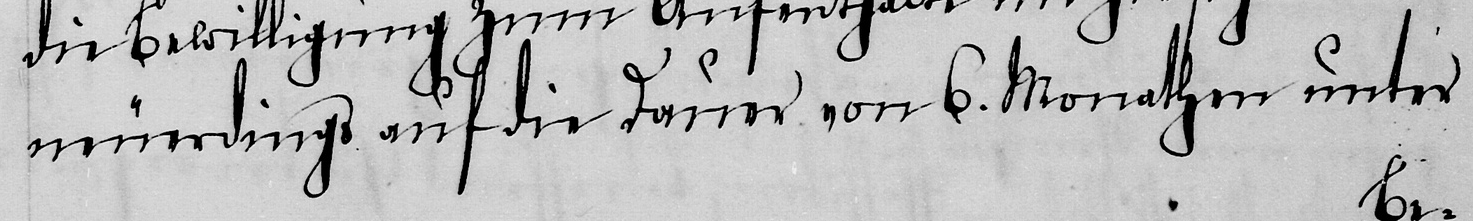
neuerdings auf die Dauer von 6. Monathen unter
